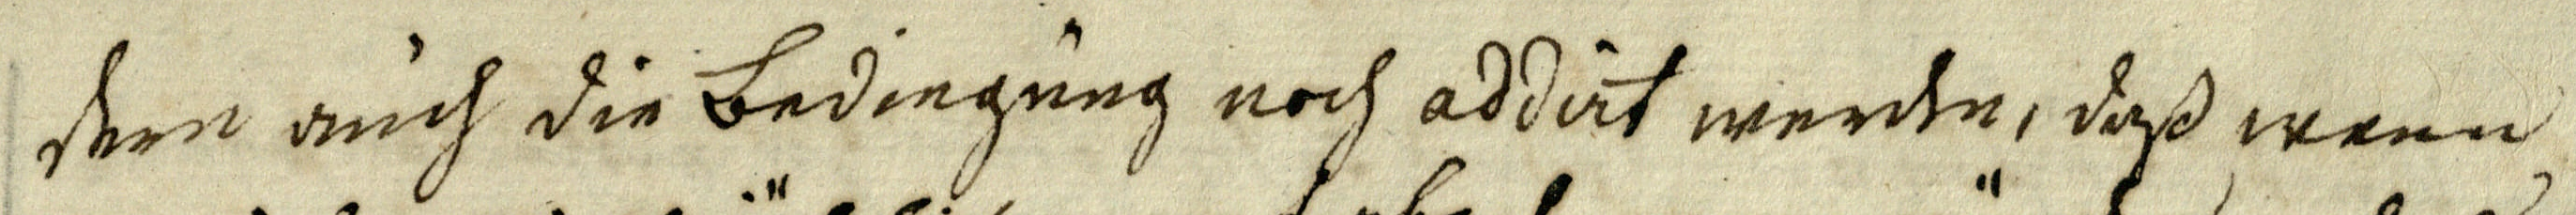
dern auch die Bedingung noch addirt werden, daß wenn
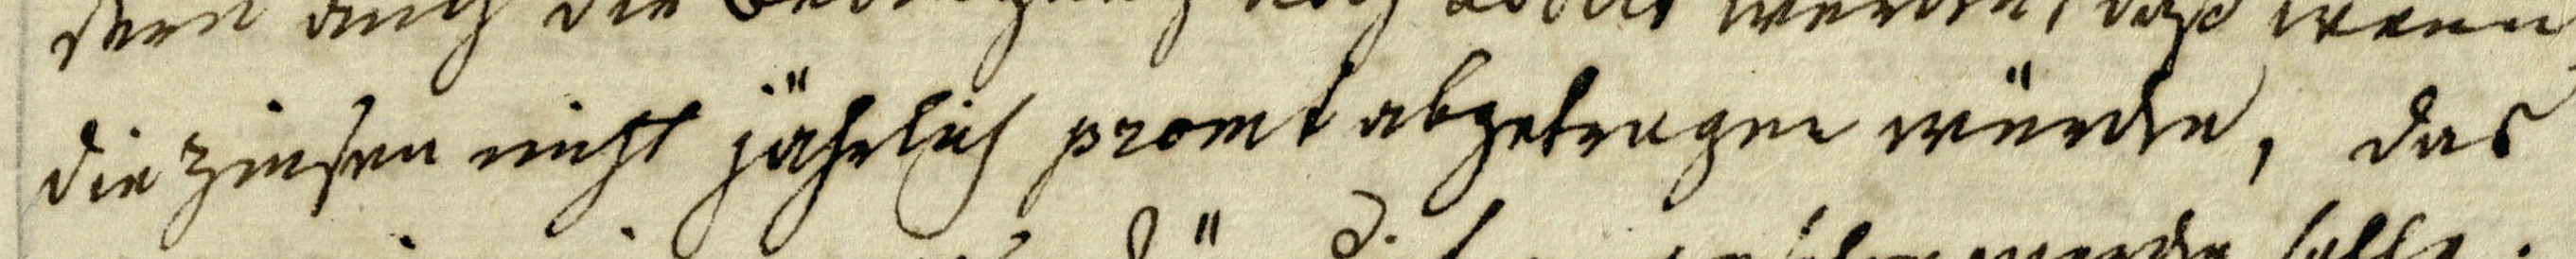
die Zinsen nicht jährlich promt abgetragen würden, das
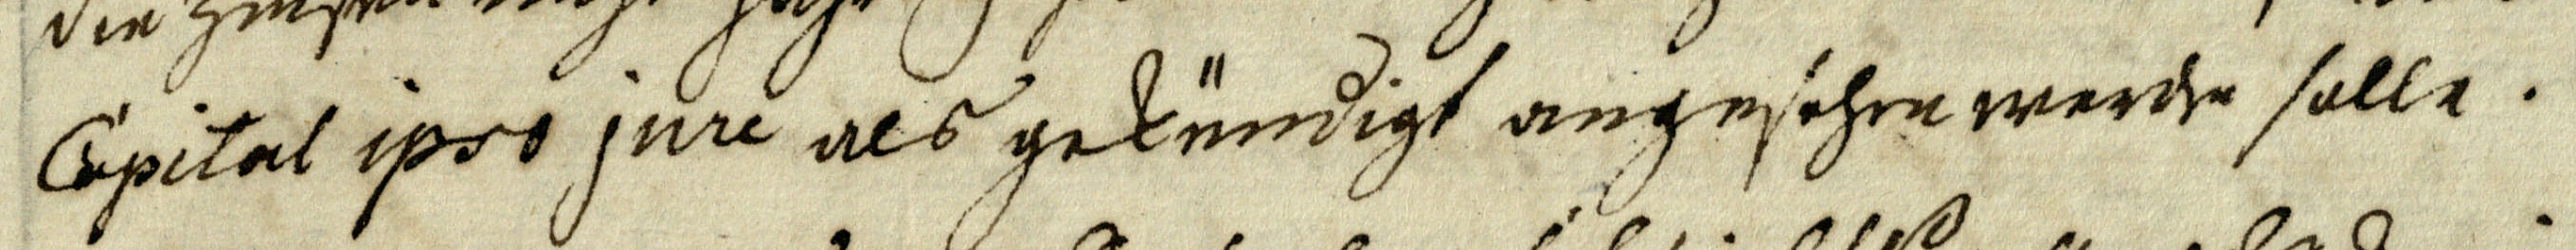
Capital ipso jure als gekündigt angesehen werden solle.
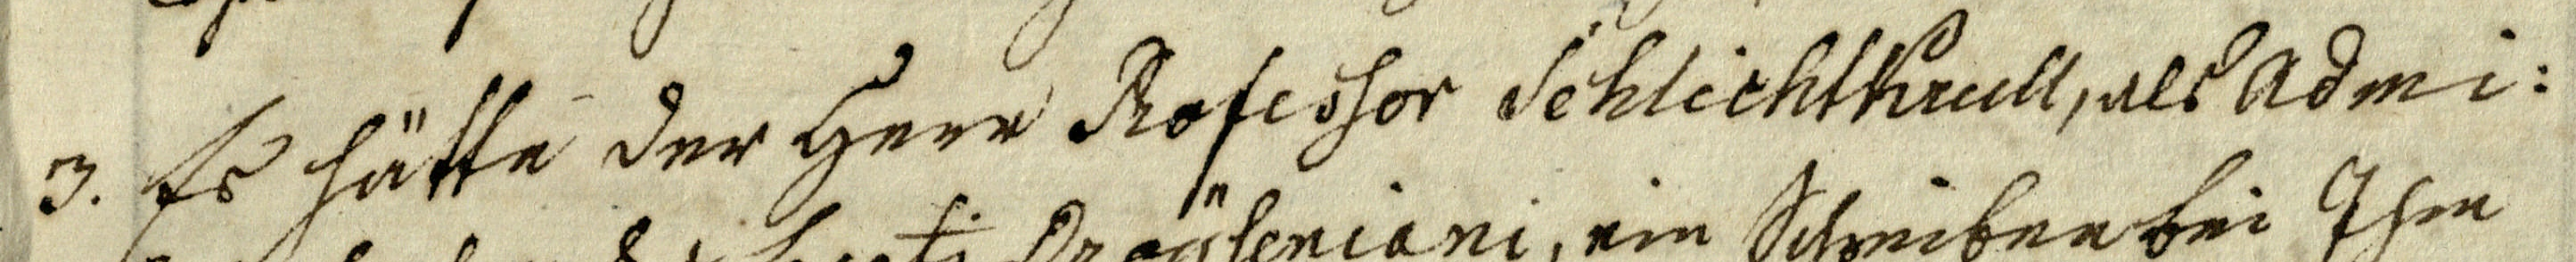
3. Es hätte der Herr Professor Schlichtkrull, als Admi¬
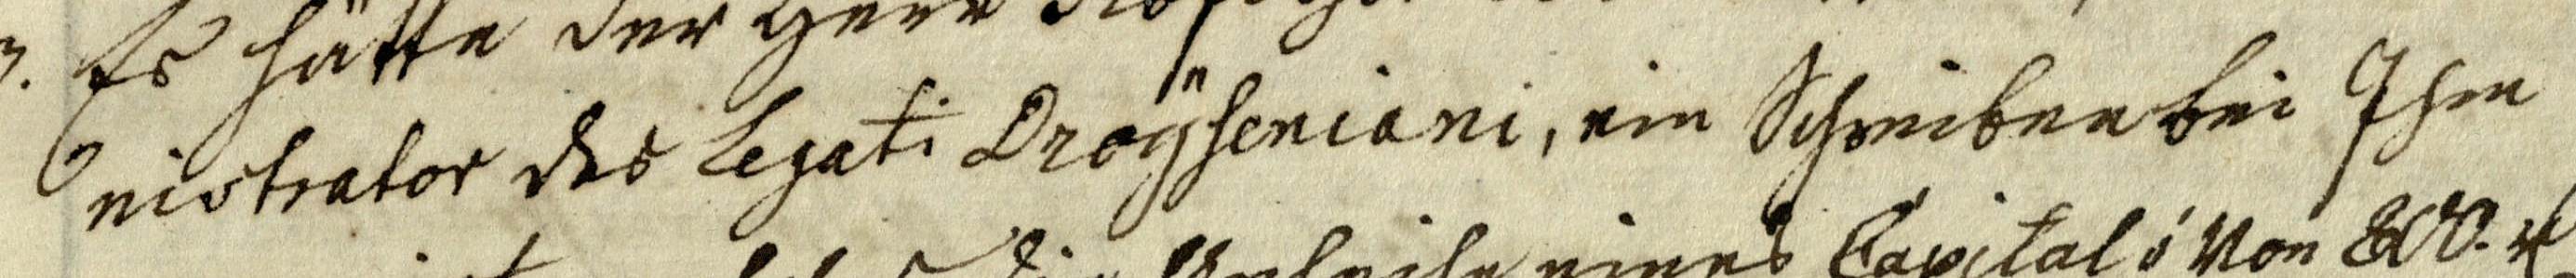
nistrator des Legati Droÿseniani, ein Schreiben bei Ihm
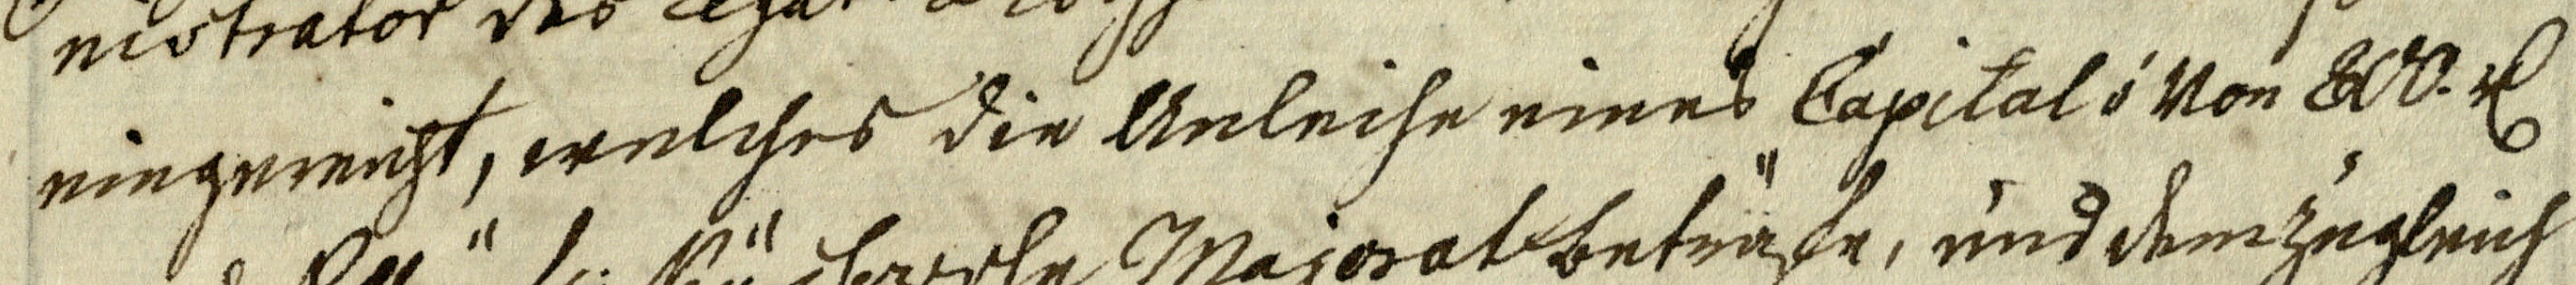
eingereicht, welches die Anleihe eines Capitals von 800. r.
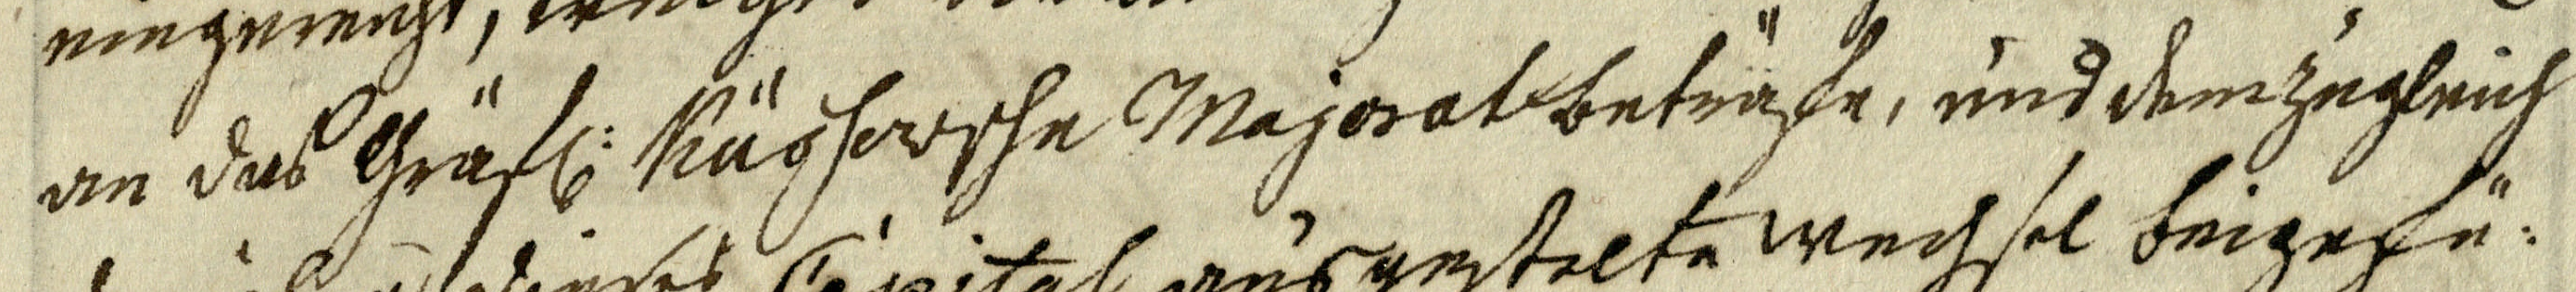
an das Gräfl. Küssowsche Majorat beträfe, und dem zugleich
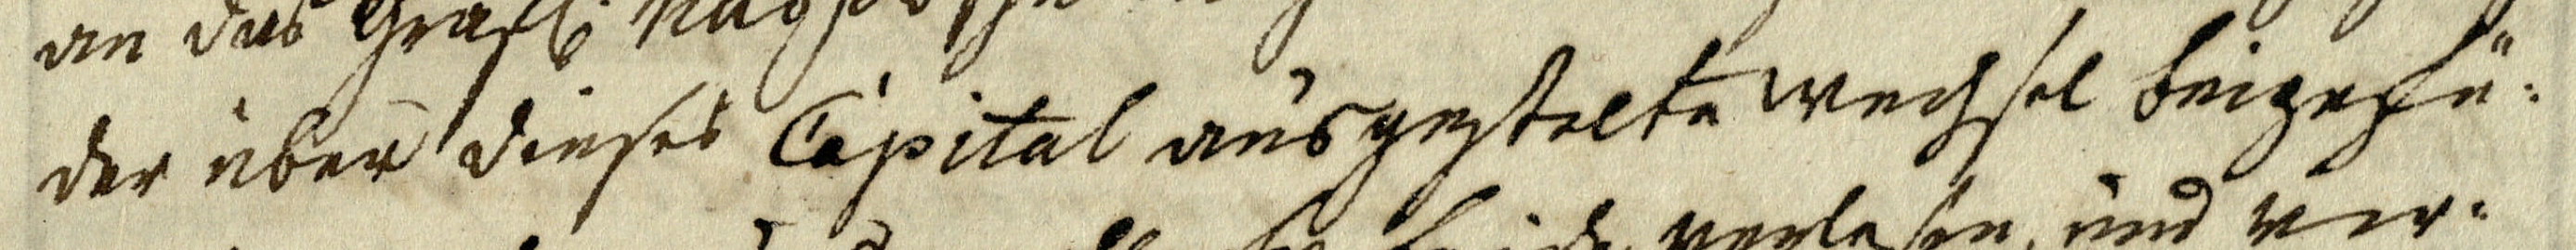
der über dieses Capital ausgestelte Wechsel beigefü¬
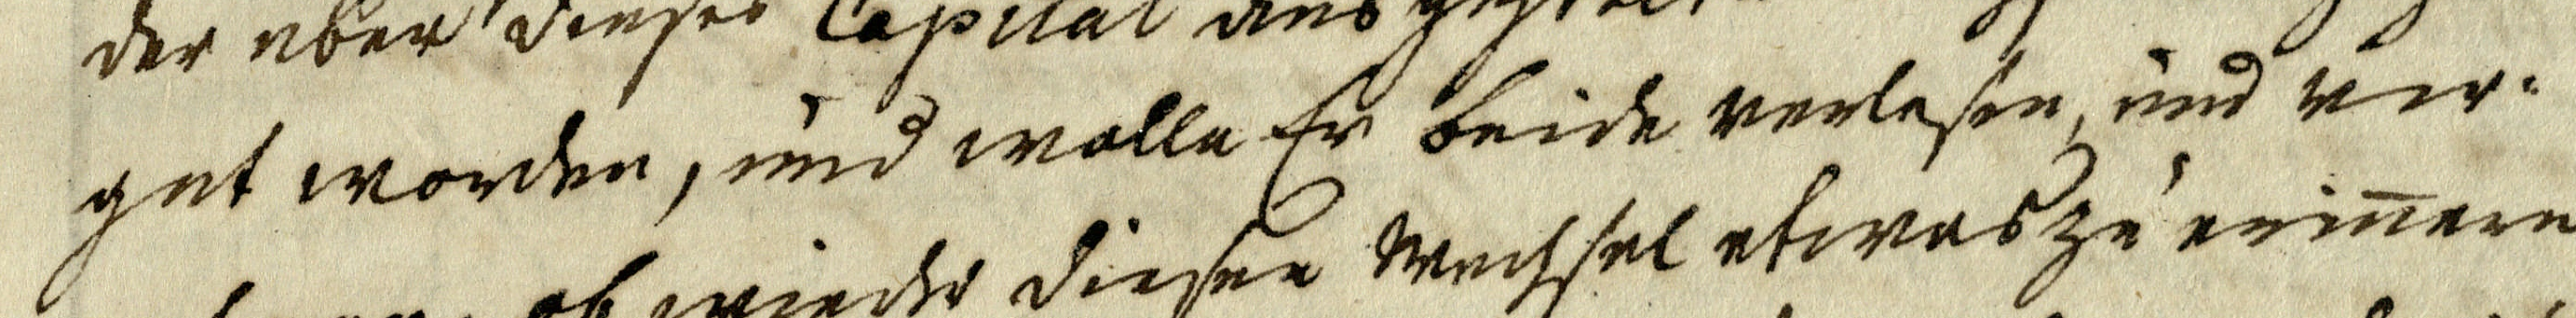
get worden, und wolle Er beide verlesen, und ver¬
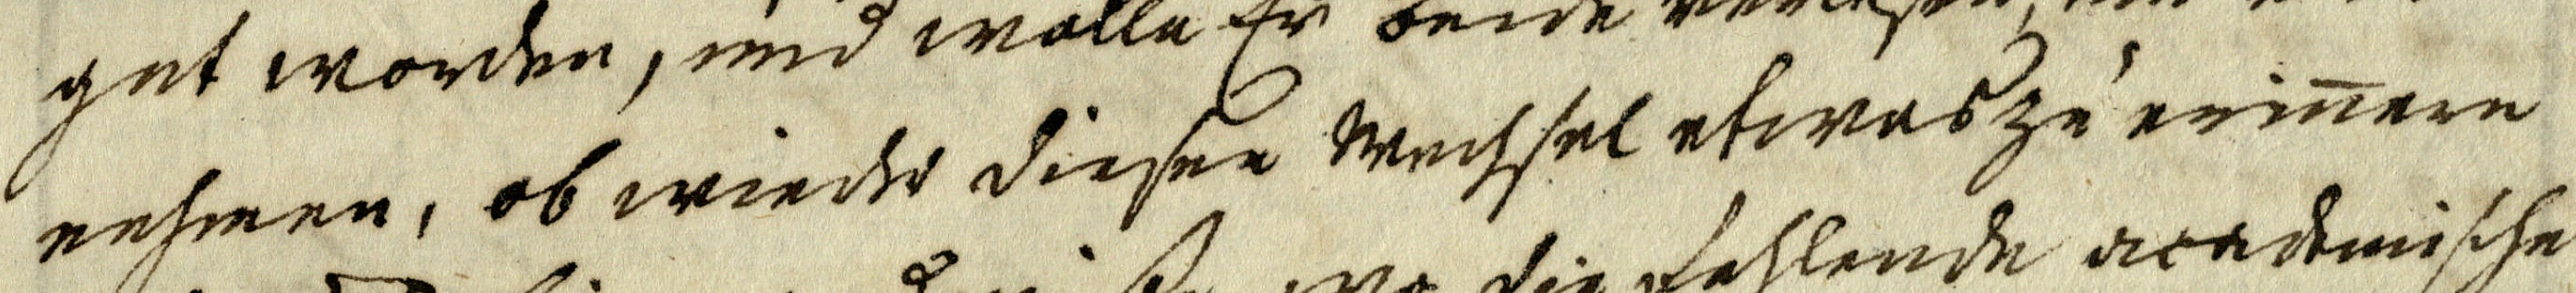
nehmen, ob wieder diesen Wechsel etwas zu erinern
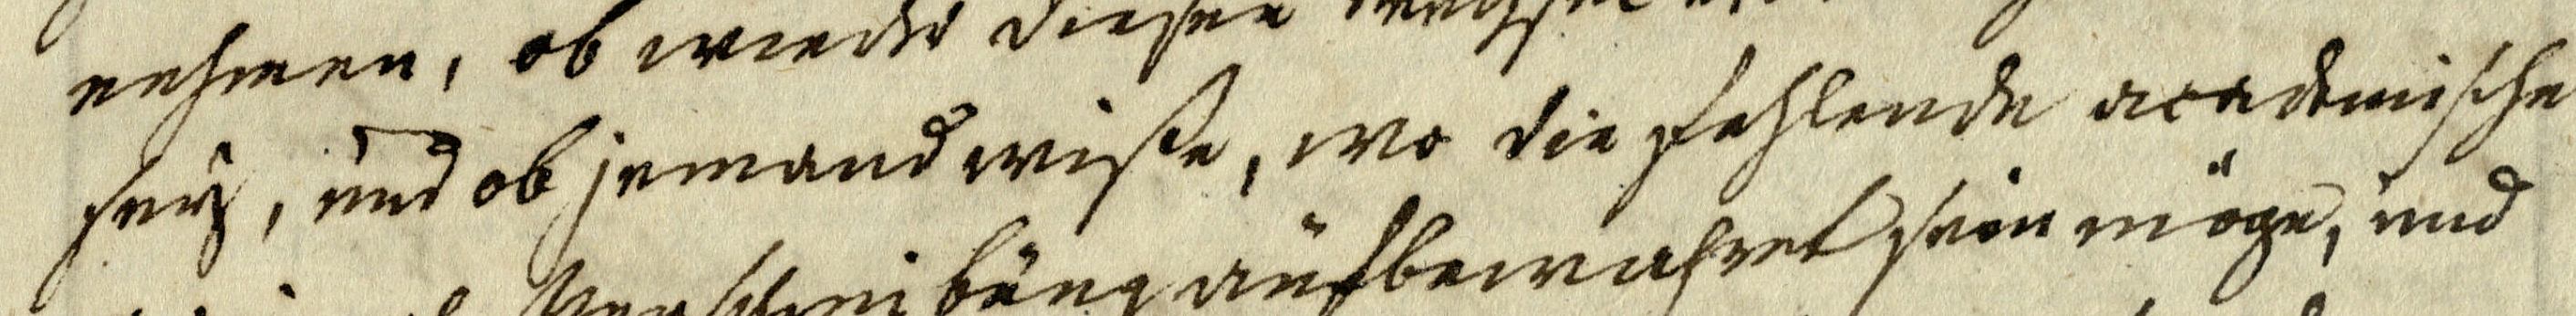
seÿ, und ob jemand wiße, wo die fehlende academische
